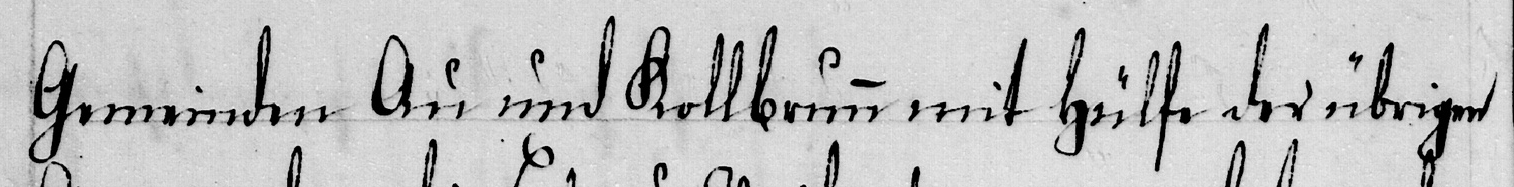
Gemeinden Au und Kollbrunn mit Hülfe der übrigen
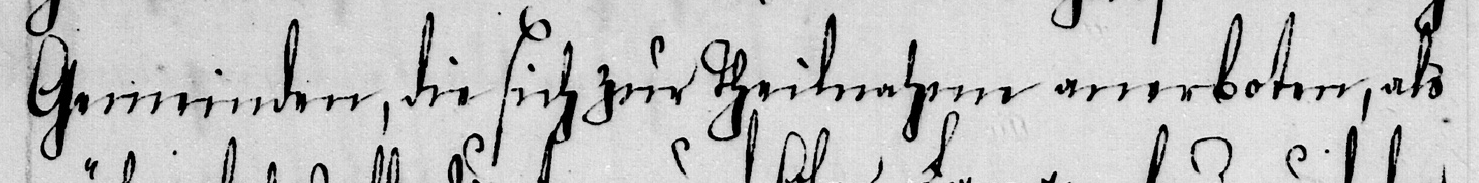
Gemeinden, die sich zur Theilnahme anerboten, als
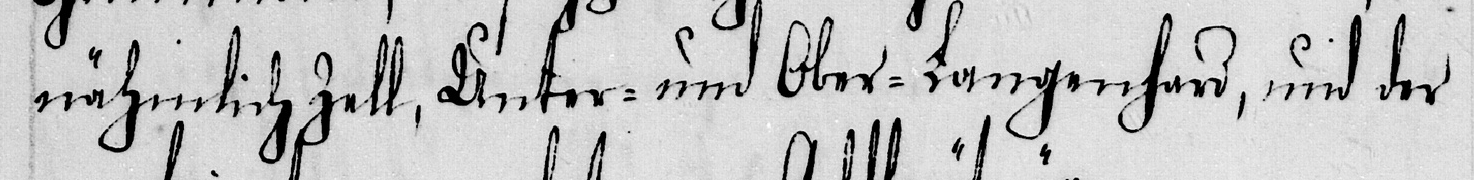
nähmlich Zell, Unter- und Ober-Langenhard, und der
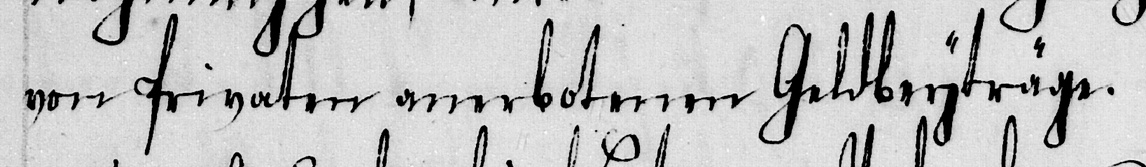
von Privaten anerbotenen Geldbeyträge.
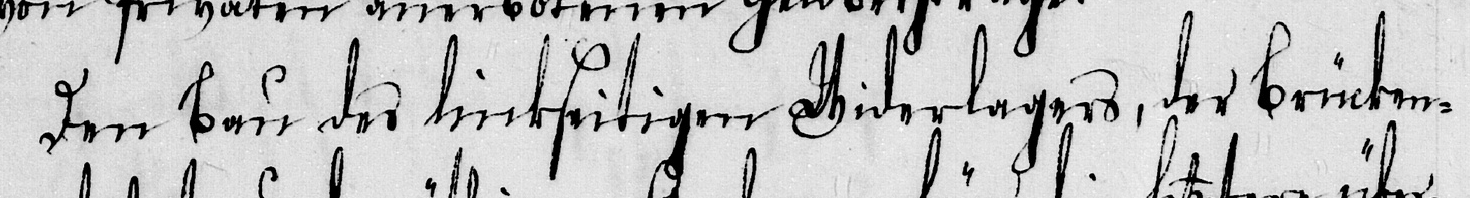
Den Bau des linkseitigen Widerlagers, der Brücken¬
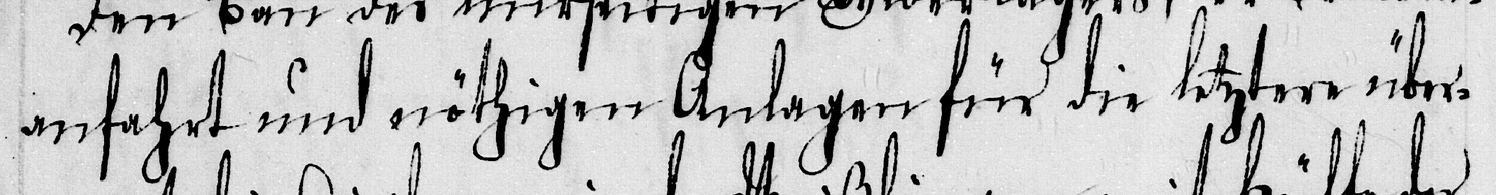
anfahrt und nöthigen Anlagen für die letztern über¬
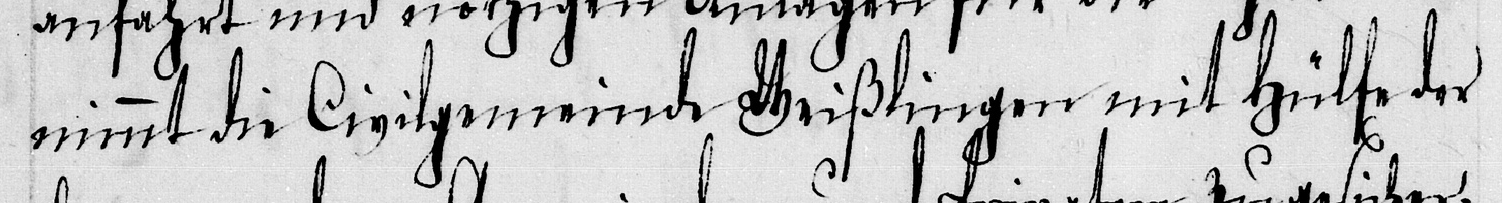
nimmt die Civilgemeinde Weißlingen mit Hülfe der
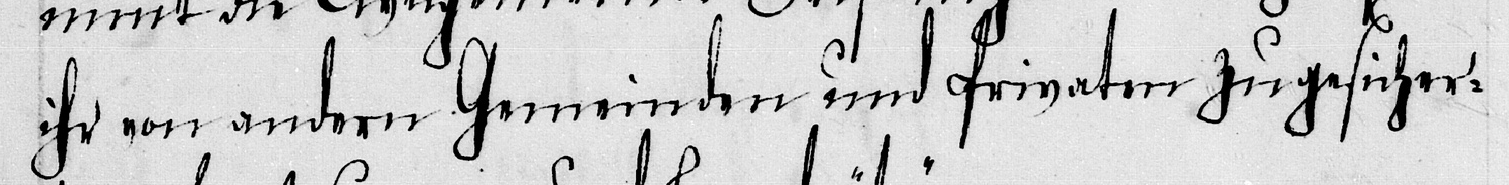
ihr von andern Gemeinden und Privaten zugesicher¬
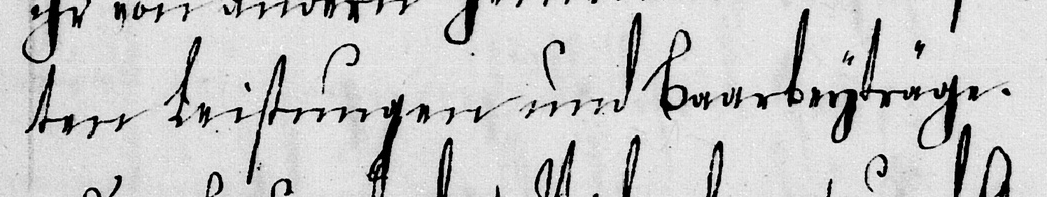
ten Leistungen und Baarbeyträge.
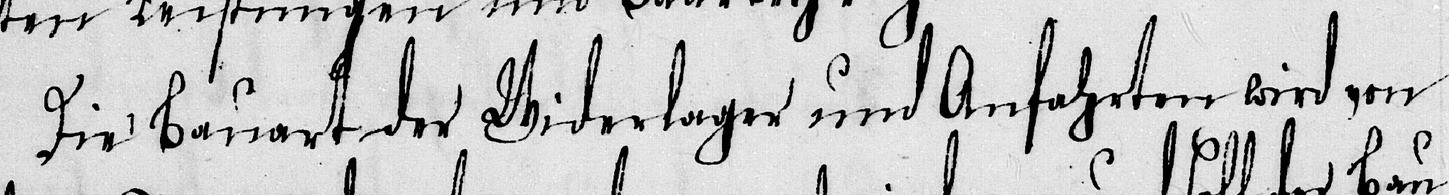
Die Bauart der Widerlager und Anfahrten wird von
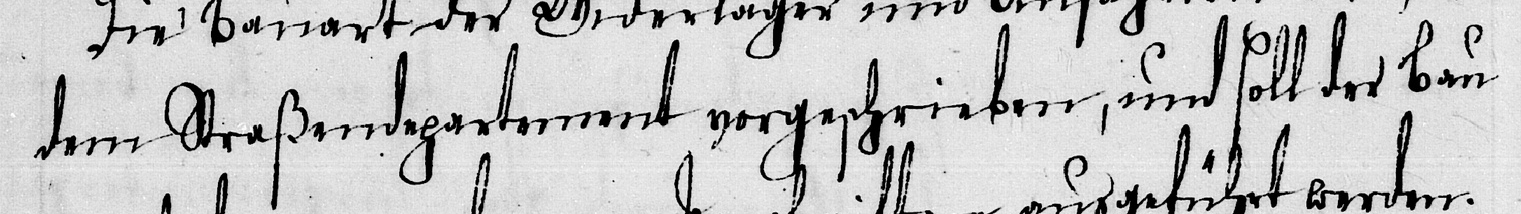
dem Straßendepartement vorgeschrieben, und soll der Bau
